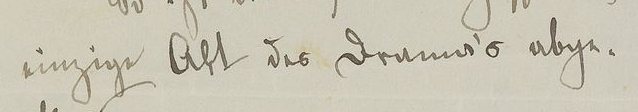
einzige Akt des Drama's abge-
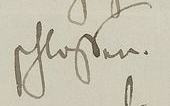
schlossen.
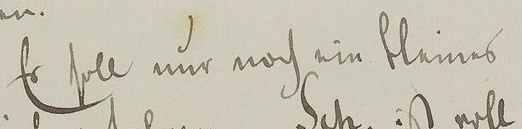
Es soll nur noch ein kleines
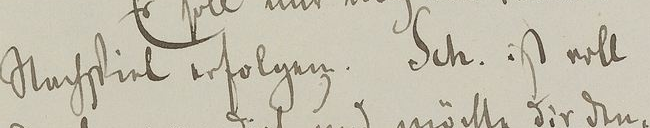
Nachspiel erfolgen. Sch. ist voll
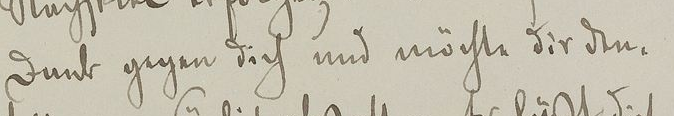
Dank gegen dich und möchte dir den-
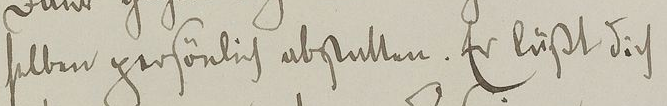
selben persönlich abstatten. Er läßt dich
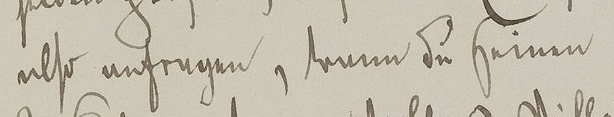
also anfragen, wann du seinen
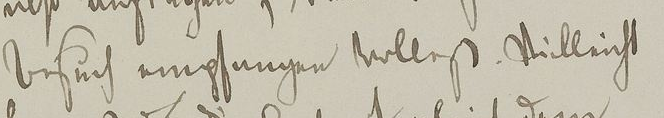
Besuch empfangen wollest. Vielleicht
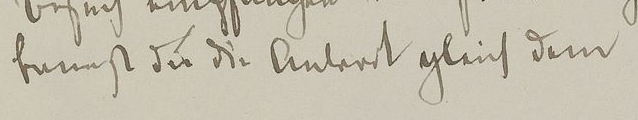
kannst du die Antwort gleich dem
